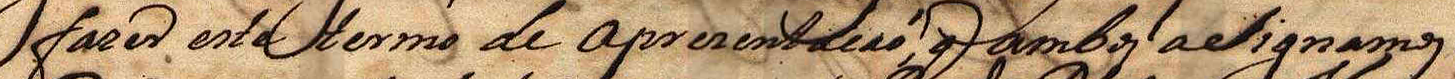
fazer este termo de aprezentaçaõ, q̄ ambos aSignamos.
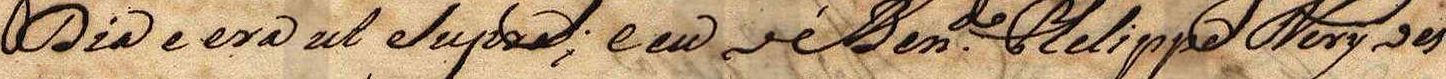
Dia e era ut Supra; e eu o Ben.do Phelippe Nery o es
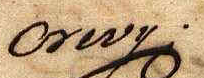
crevy:
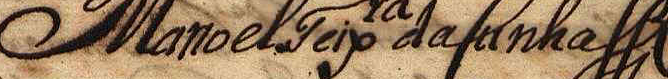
Manoel Teixra da Cunha
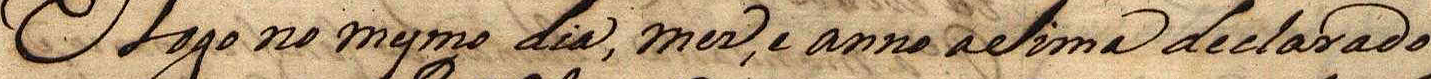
E Logo no mesmo dia, mez, e anno aSima declarado
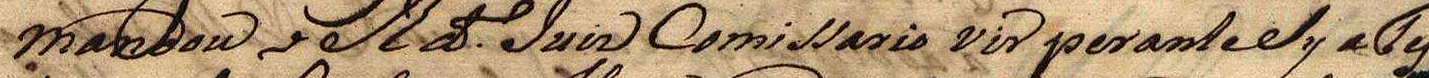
mandou o Rd.o Iuiz Comissario vir perante Sy a Tes
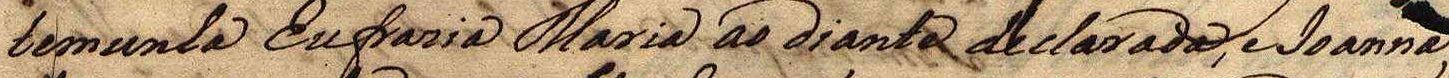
temunha Eufrazia Maria ao diante declarada, e Ioanna
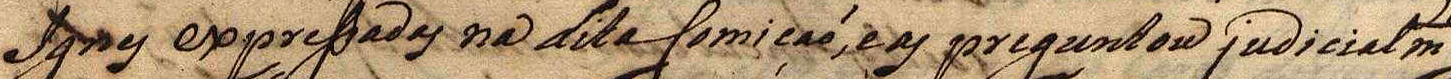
Ignes expressadas na dita Comiçaõ, e as preguntou judicialm.te
